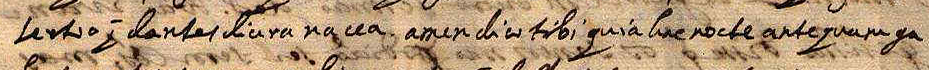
serto o q̄ dantes dicera na cea. amen dico tibi quia hac nocte ante quam ga
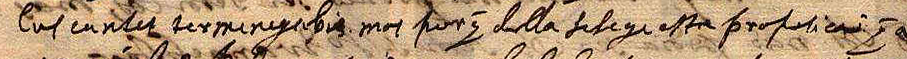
lus cantet ter me negabis. mas porq̄ della se sege esta proposiçaõ q̄ a
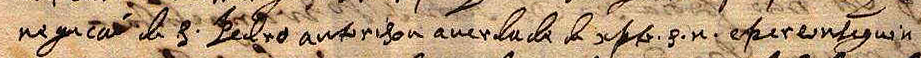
negaçaõ de S. Pedro autorisou a uerdade de xpto. s. n. e per conseguin
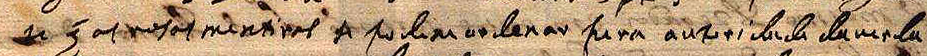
te q̄ as nosas mentiras se podem ordenar pera autoridade da uerda
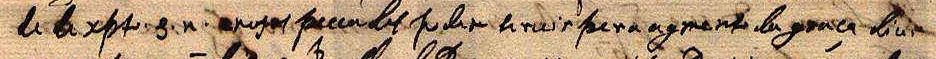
de de xpto. s. n. e nosos peccados podem seruir pera agmento da graça diui
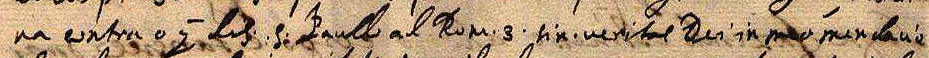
na contra o q̄ dis .S. Paullo ad Rom. 3. sin. ueritas Dei in meo mendacio
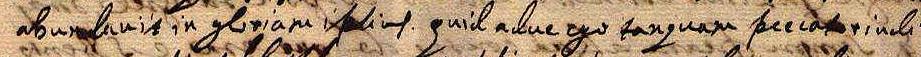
abundauit in gloriam ipsius quid aduc ego tanquam peccator iudi
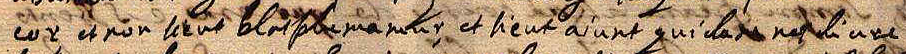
cor et non sicut blasfemamur, et sicut aiunt quidam nos dicere
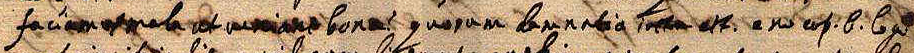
faciamus mala ut ueniant bona? quorum damnatio iusta est. e no cap. 6. logo
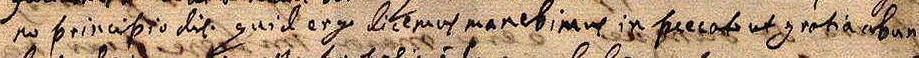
no principio dis. quid ergo dicemus manebimus in peccato ut gratia abun
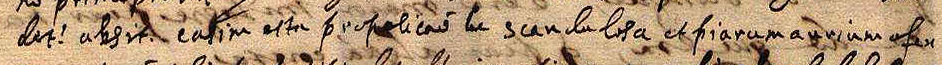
det? absit. e asim esta proposiçaõ he scandalosa et piarum aurium ofen
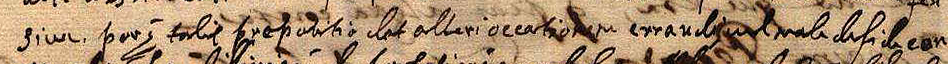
siua. porq̄ talis prepositio dat alteri occasionem erraudiuel male defide con
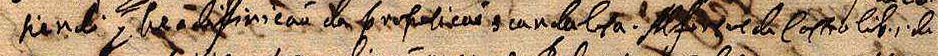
siendi q̄ he a diffiniçaõ da proposiçaõ scandalosa. Alfonsus de Castro lib. 1. de
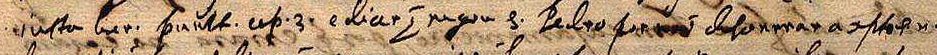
iusta her. punit. cap. 3. e dicer q̄ negou s. Pedro por naõ desonrrar a xpto s. n.
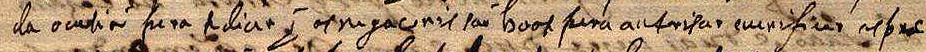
da ocasiaõ pera se dicer q̄ as negaconis saõ boas pera autorisar e uerificar as pre
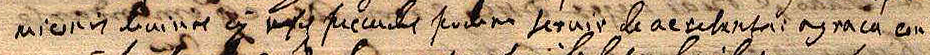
uiçonis diuinas e q̄ nosos peccados podem seruir de acresentar a graça con
